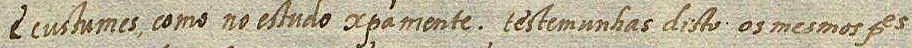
e custumes, como no estudo xpāmente. testemunhas disto os mesmos pes
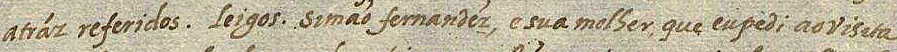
atráz referidos. Leigos. simão fernandez̄, e sua molher que eu pedi ao visita
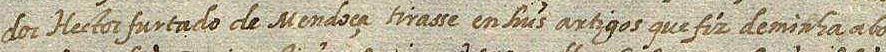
dor Hector furtado de Mendoça tirasse em hūs artigos que fiz de minha abo
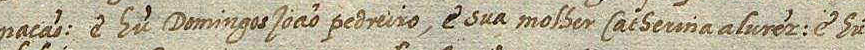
nação: e hū Domingos João pedreiro, e sua molher Catherina alurez̄: e hū
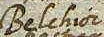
Belchior
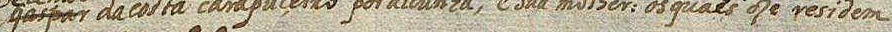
gaspar da costa carapuçeiro por alcunha, e sua molher: os quais oje residem
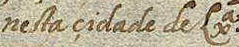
nesta çidade de Lxa.
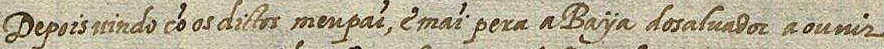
Depois uindo cō os dictos meu paī, e maĩ pera a Baya do saluador a ouuir
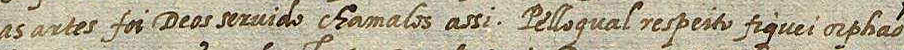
as artes foi Deos seruido chamalos a ssi. Pello qual respeito fiquei orphaõ
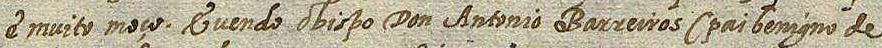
e muito moço. E uendo o bispo Don Antonio Barreiros (pai benigno de
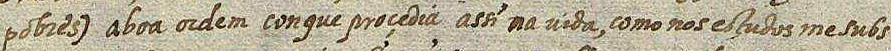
pobres) a boa ordem con que proçedia assī na uida como nos estudos me subs
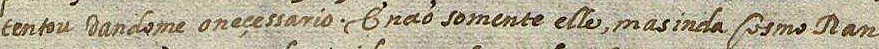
tentou dandome o neçessario. E naõ somente elle, mas inda Cosmo Ran
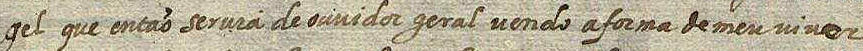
gel que entaõ seruia de ouuidor geraluendo a forma de meu uiuer
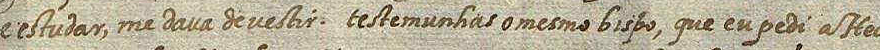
e estudar, me daua de uestir. testemunhas o mesmo bispo, que eu pedi a Hec
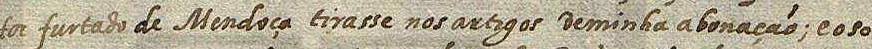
tor furtado de Mendonça tirasse nos artigos de minha abonaçaõ; e o so
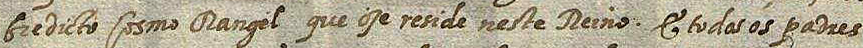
bredicto Cosmo Rangel que oje reside neste Reino. E todos os padres
